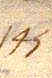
145
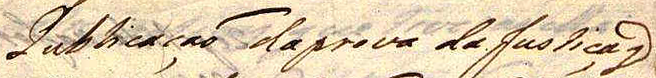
Publicaçaõ da prova da Justiça q̄
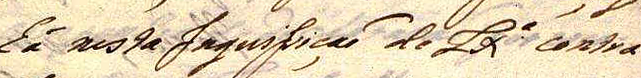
há nesta Jnquissiçaõ de Lx.a contra
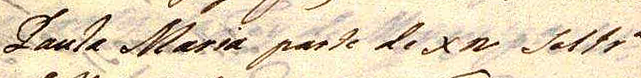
Paula Maria parte de xn soltr.a
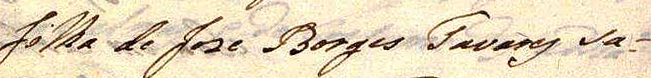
filha de Joze Borges Tavares sa
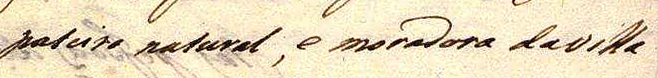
pateira natural, e moradora da villa
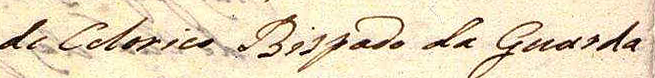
de Celorico Bispado da Guarda
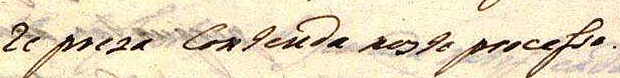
Re preza conteuda neste processo.
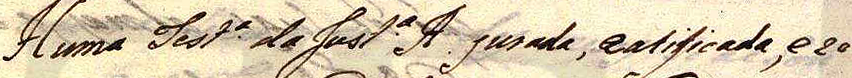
Huma Test.a da Just.a A. jurada, ratificada, e re
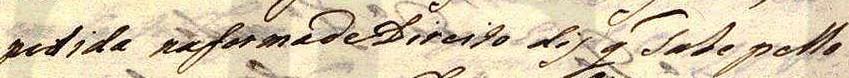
pedida na forma de Direito dis q̄ sabe pello
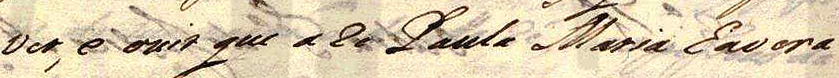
ver, e ouvir que a Re Paula Maria havera
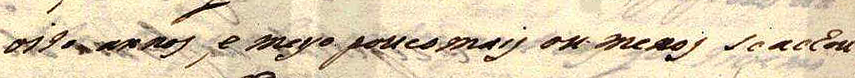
oito annos, e meyo pouco mais ou menos se achou
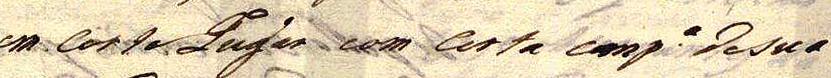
em certo Lugar com certa comp.a de sua
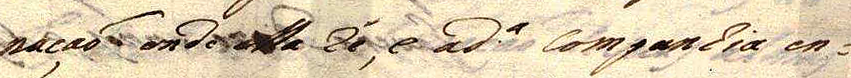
naçaõ onde ella Ré, e a d.a Companhia en
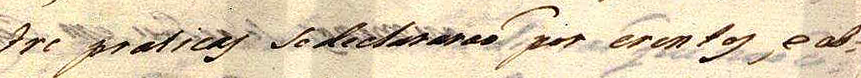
tre praticas se declararaõ por crentes, e ob
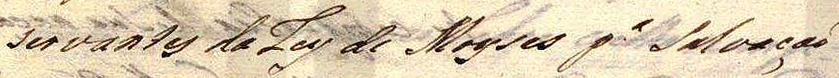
servantes da Ley de Moyses p.a salvaçaõ
